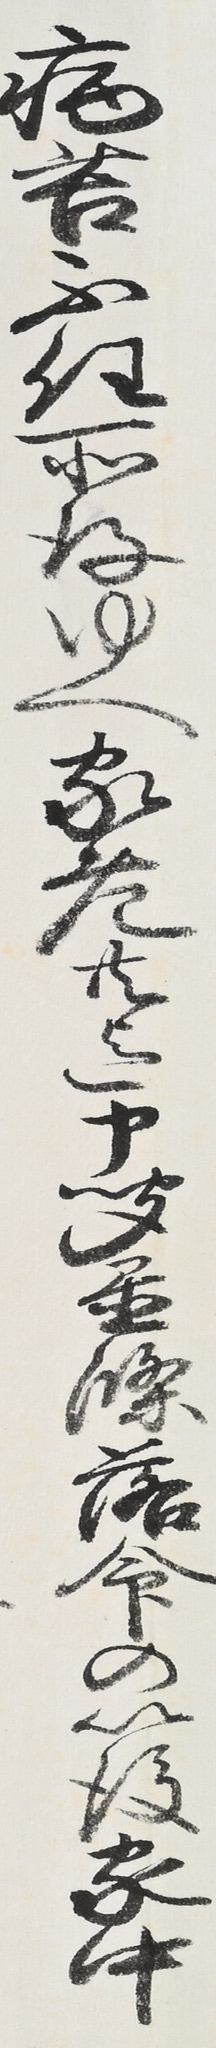病苦不任所存ゆへ家老共迄申聞置條落命の以後家中
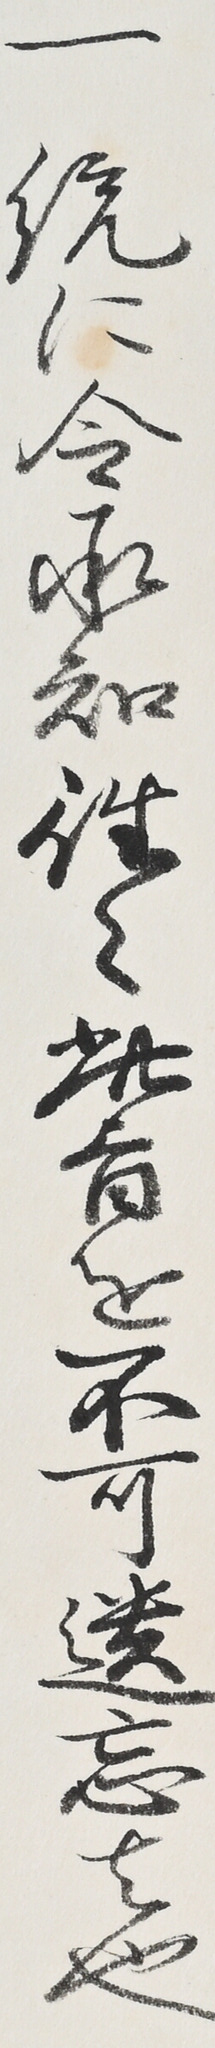一統に令承知往々此旨を不可遺忘者也

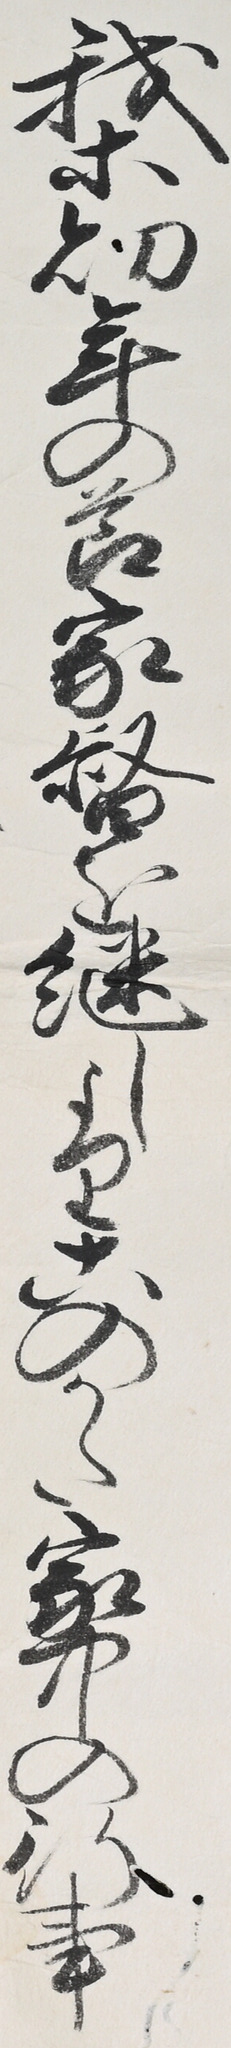我等幼年の節家督を継しよりこのかた家中の行事
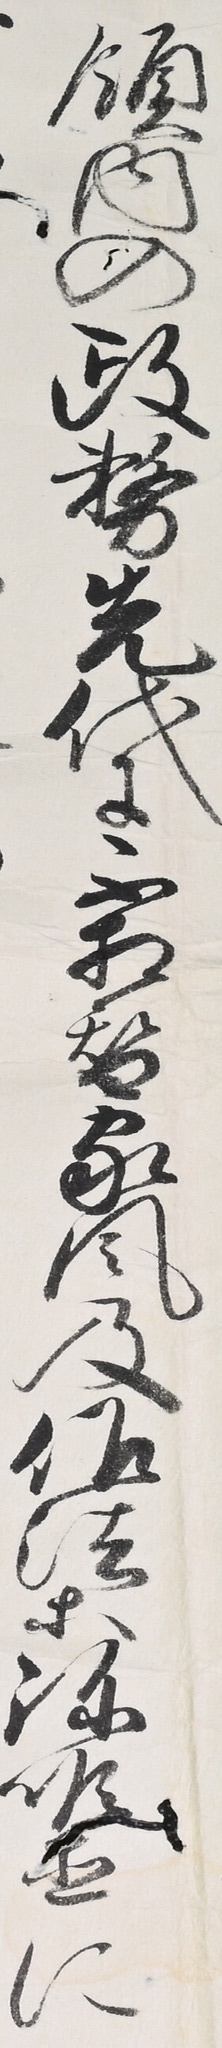領内の政務先代に不相替家風及作法等弥順直に
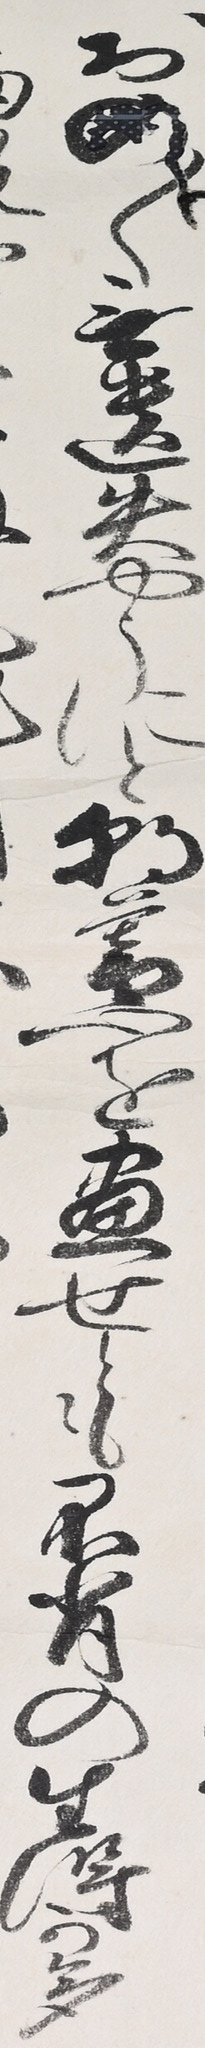おの〳〵無遺失やうにと朝暮心を尽せとも不肖の生得可多
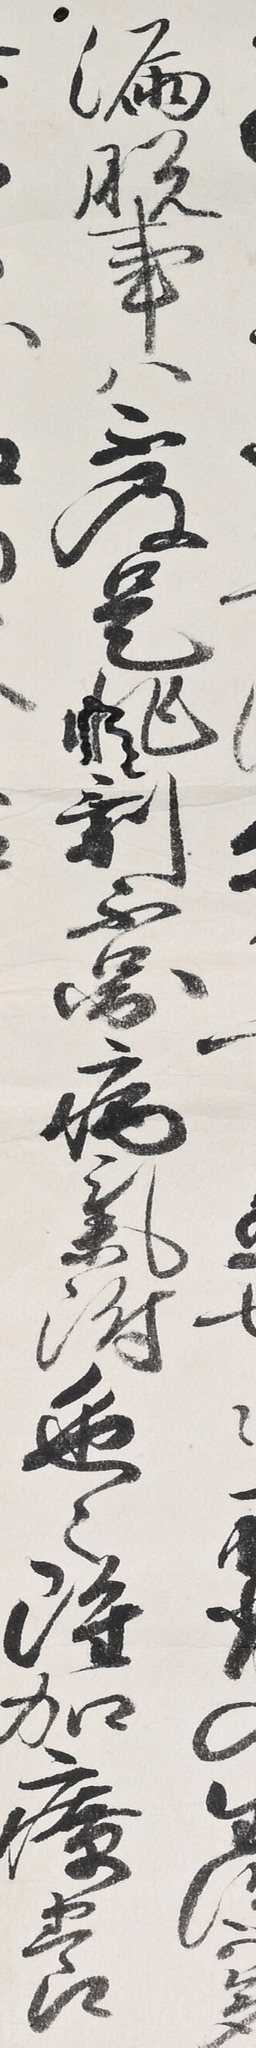漏脱事は不及是非剰不図病気附色々加療養
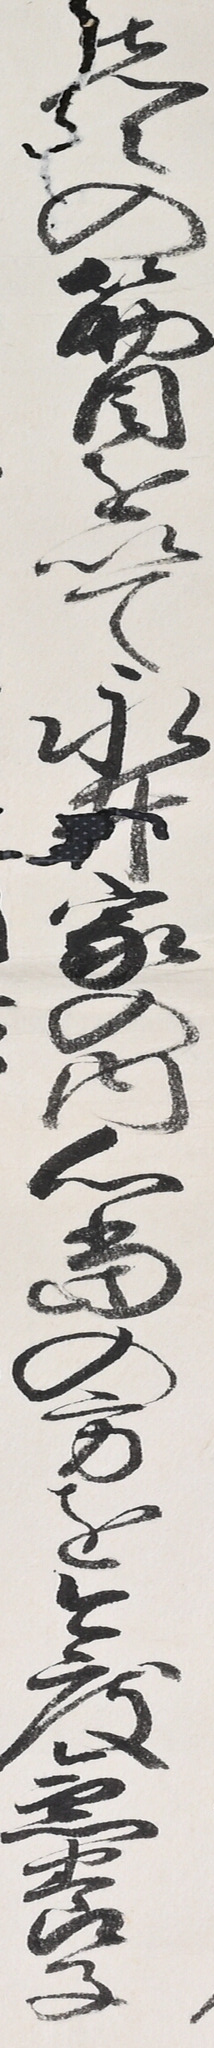先々の筋目を以て永井家の内心当の方を今度急養子
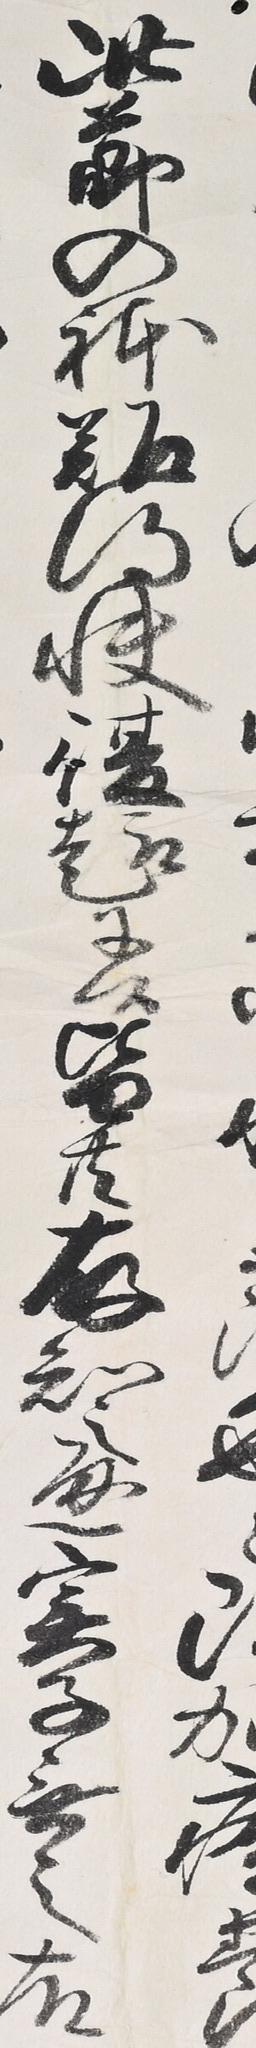此節の躰難得快復趣に候皆共存知之通実子無之故
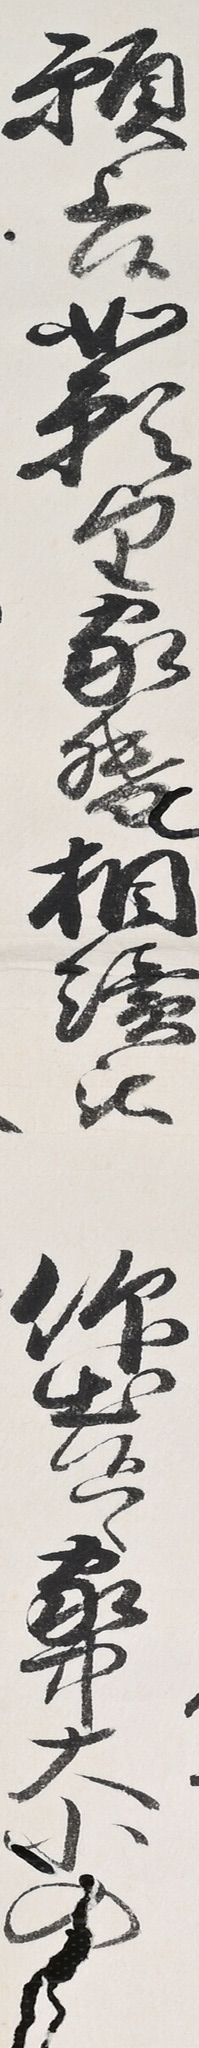願上候如願望家督相続被仰出候はゝ家中大小の
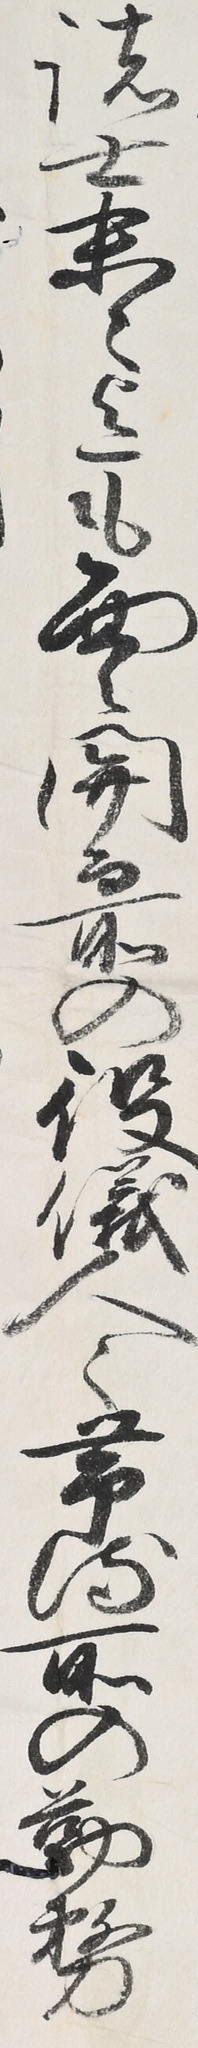諸士末々迄も面々開る所の役儀人々帯る所の勤務
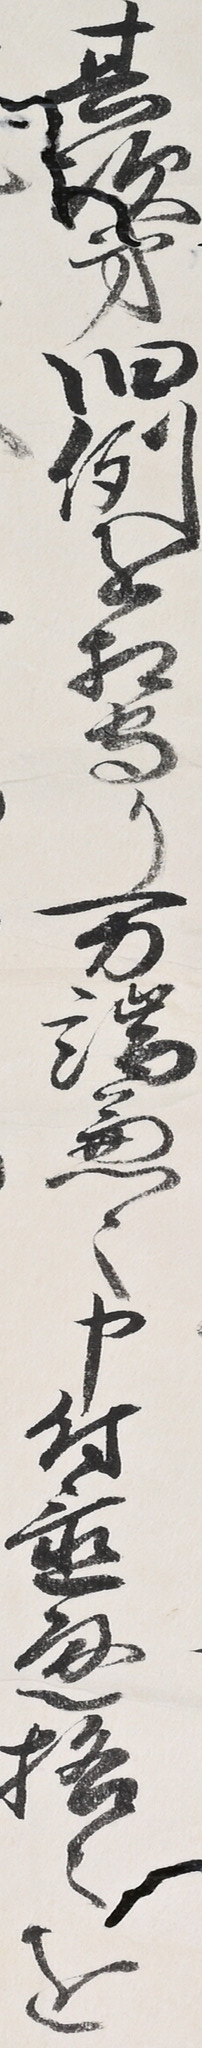其次第旧例を相守り万端兼々申付置通格々を
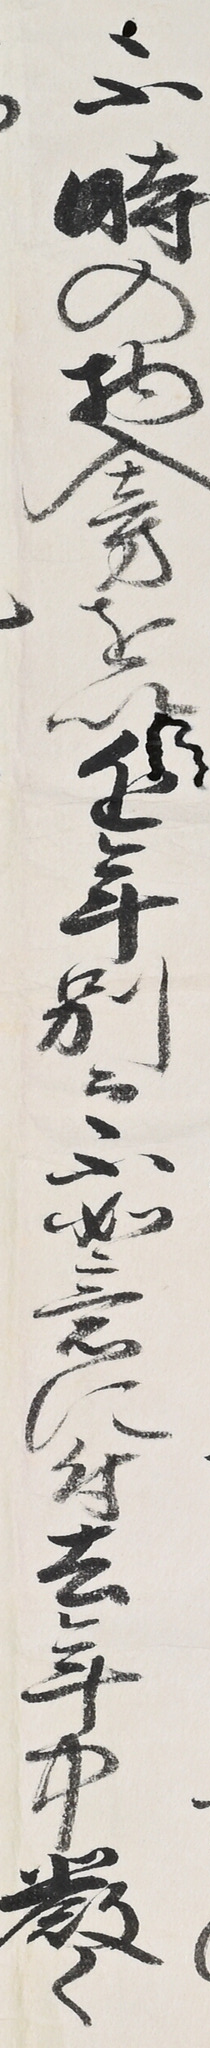不時の物入旁を以近年別て不如意に付去年中厳
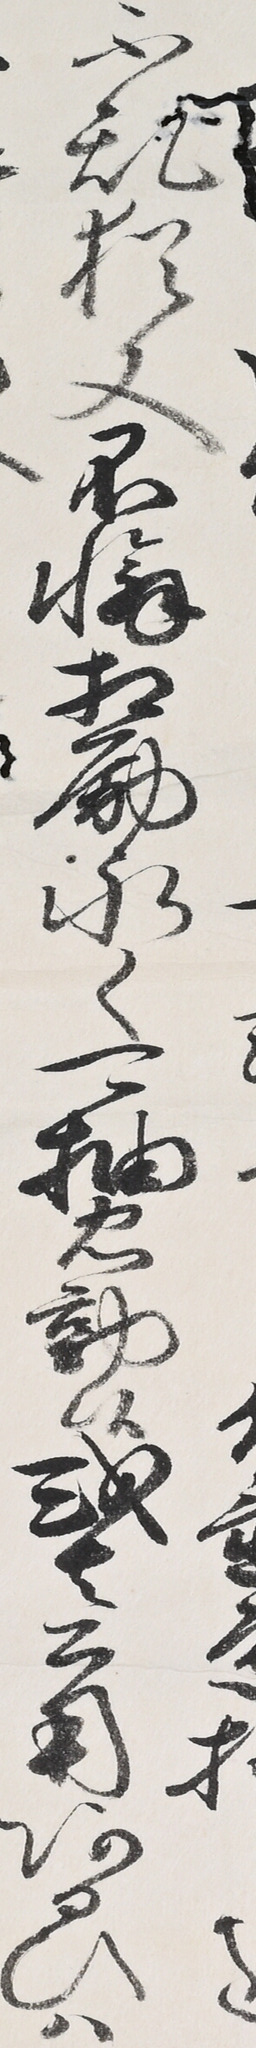不乱猶又不懈相励永く可抽忠勤候或は公用あるひは
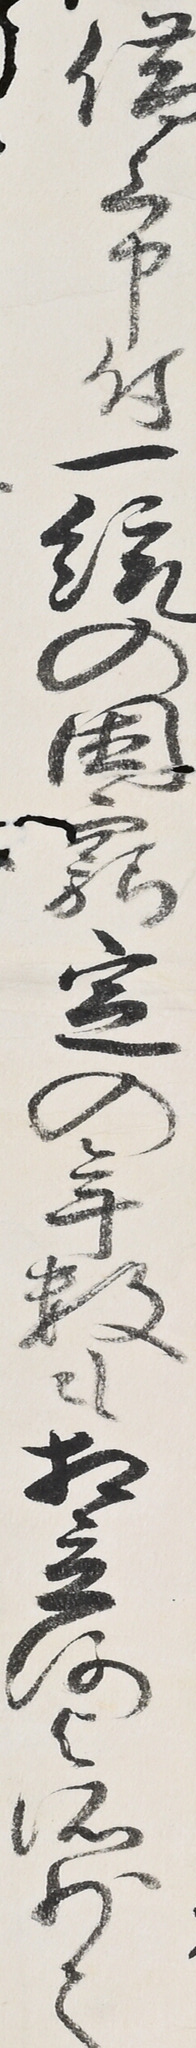借上申付一統の困窮定の年数も相立何とそ少々
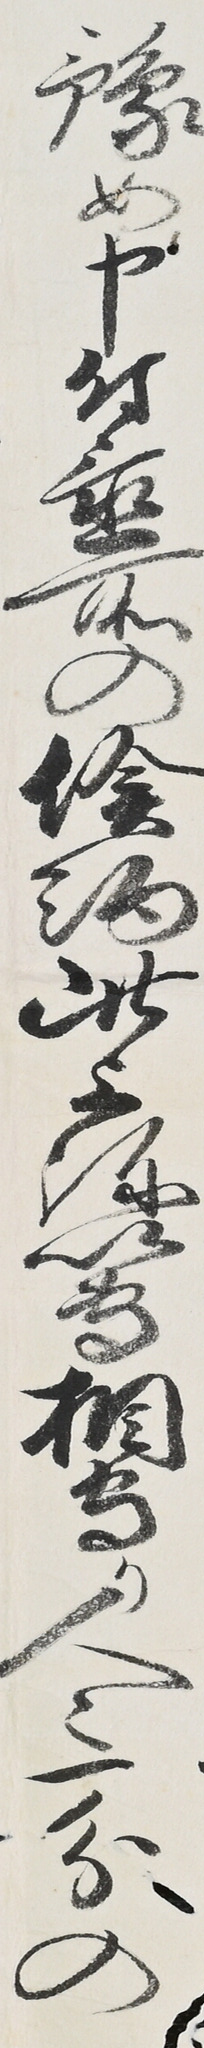予め申付置所の倹約此上弥以専相守り人々一分の
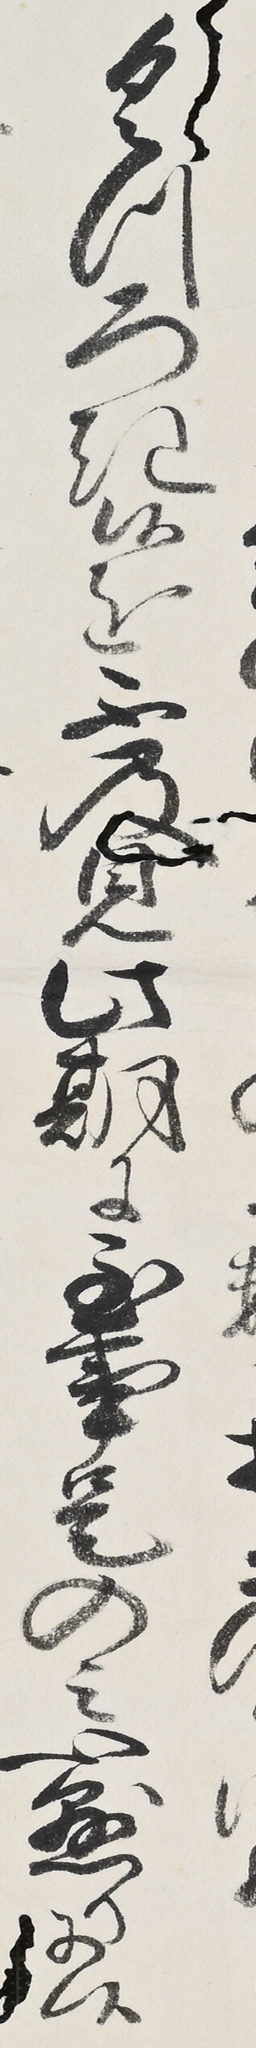くつろき候を不及見此期に至事是のみ心懸りに候
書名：御遺言〔写共二通一括〕
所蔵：伊那市立高遠町図書館・合同会社AMANE
